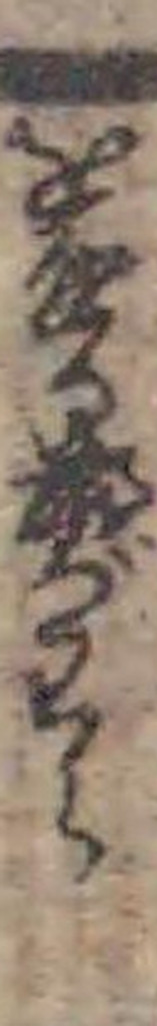を通るがわら
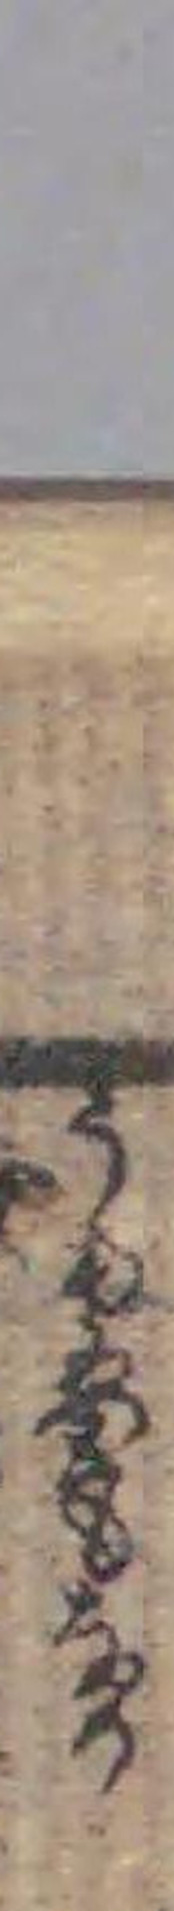うもつもなり
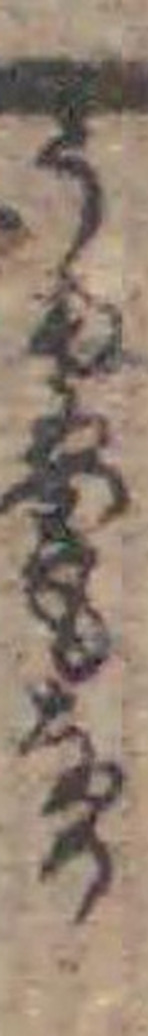うもつもなり
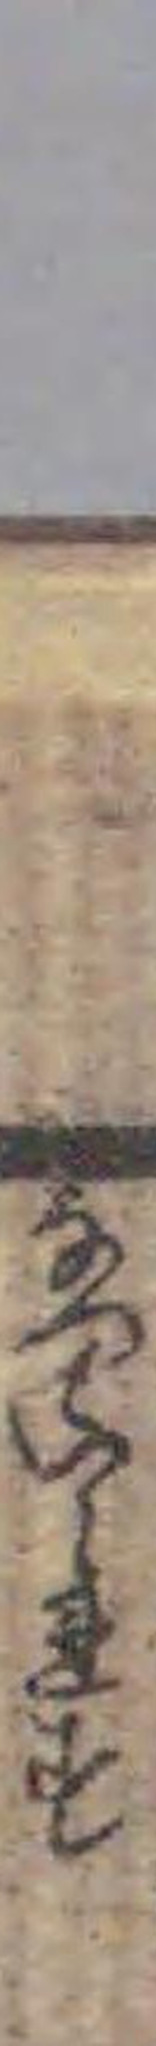なつていられす
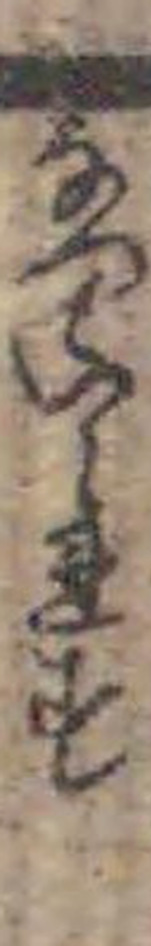なつていられす
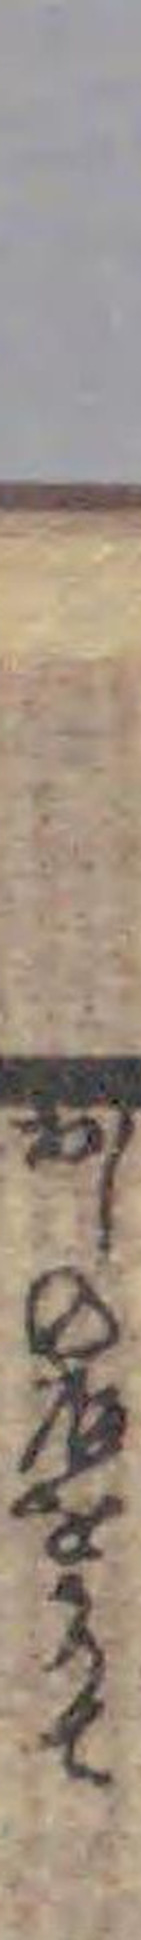おしの店をかりて
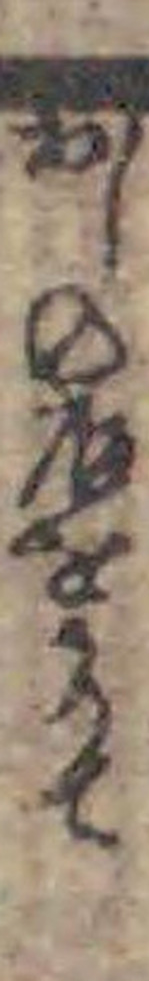おしの店をかりて
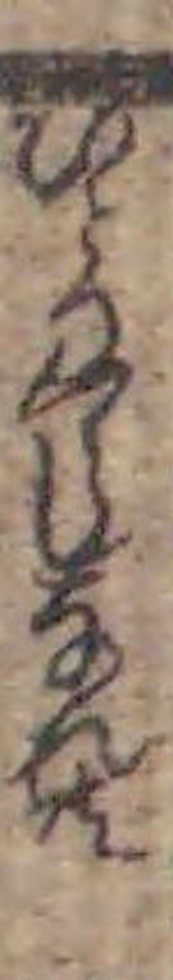ひとつくらしなれ共
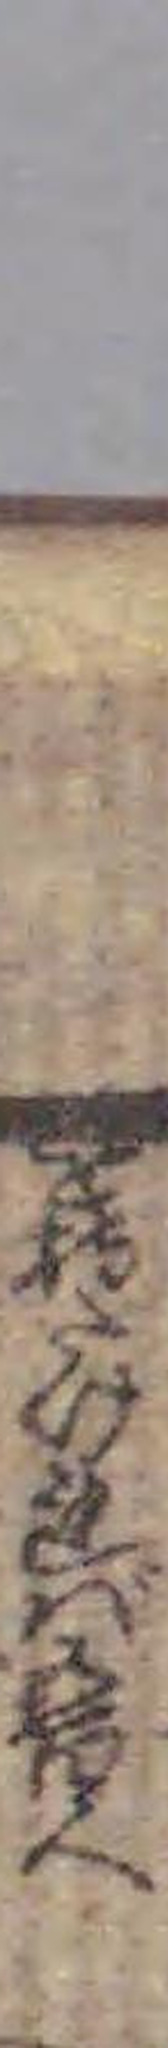を持たければ五百人
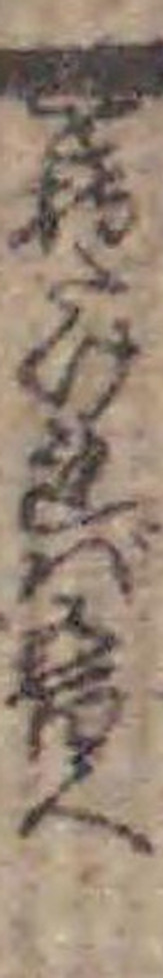を持たければ五百人
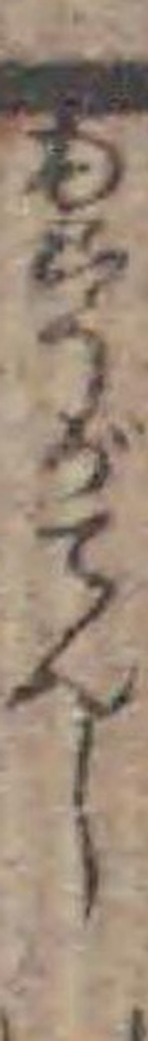もとうがてんし
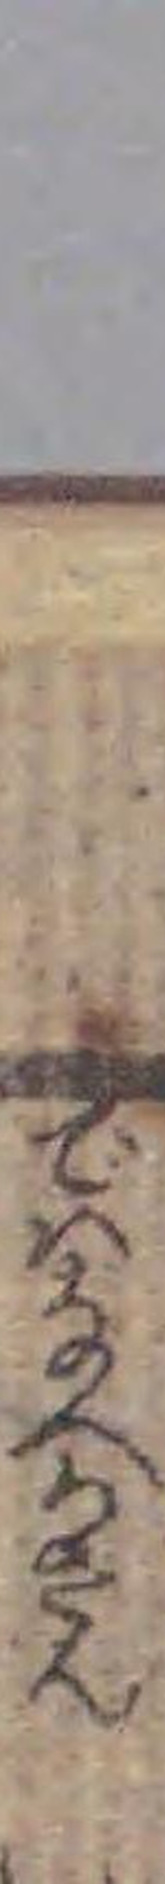ではなへかさん
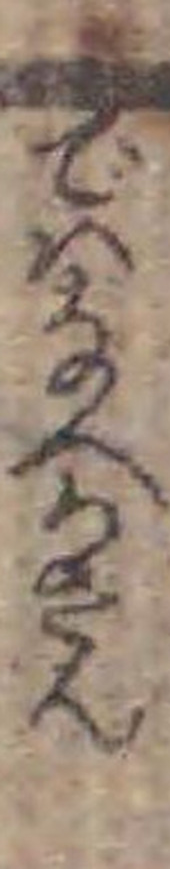ではなへかさん
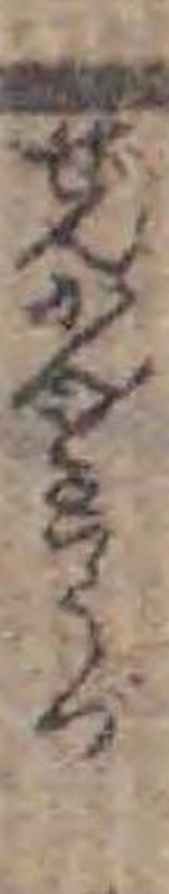ぜんかんをもたづ
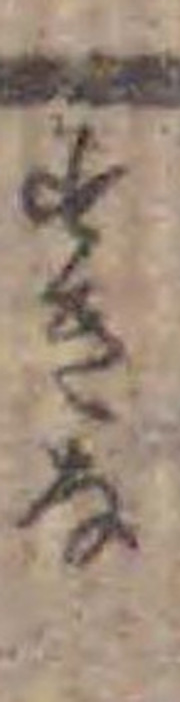すきな
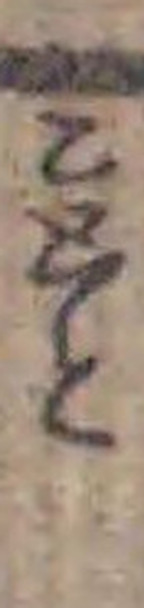ことと
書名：通風伊勢物語 : 3巻
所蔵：国立国会図書館 National Diet Library, JAPAN
